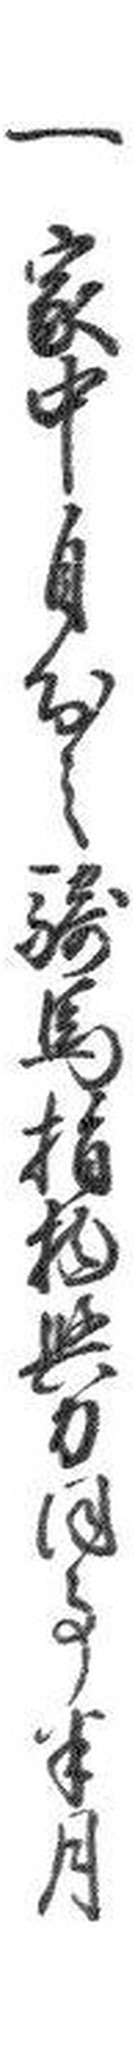一家中自分之騎馬指物与力同事半月
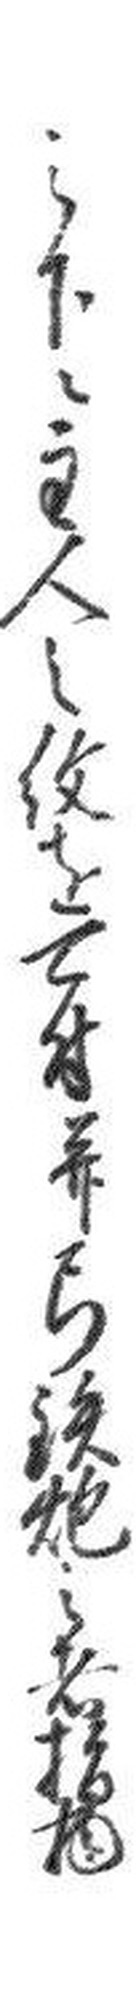之下ニ主人之紋を可付并弓鉄砲之者指物
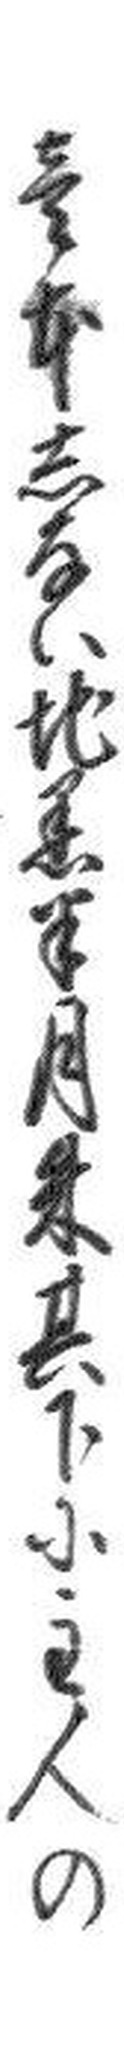壱本しない地黒半月朱其下に主人の
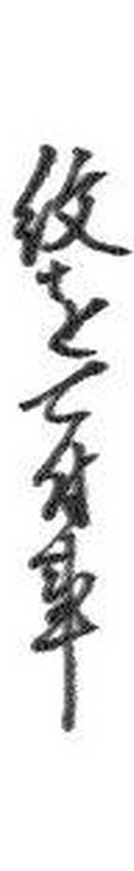紋を可付事
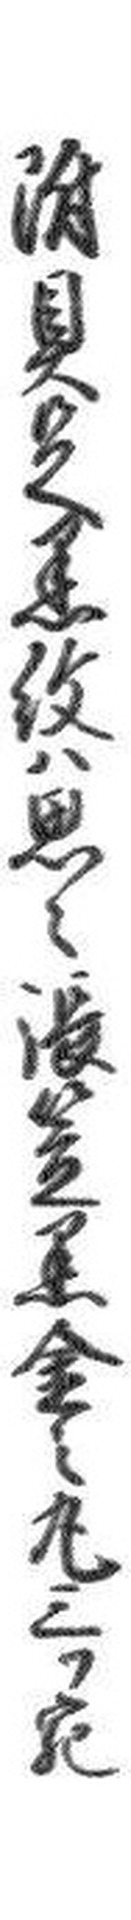附具足黒紋ハ思々張笠黒金之丸三ツ宛
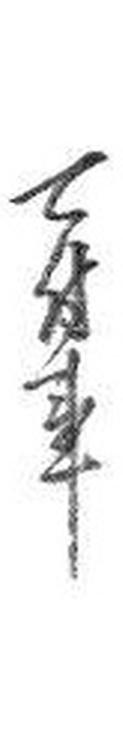可付事
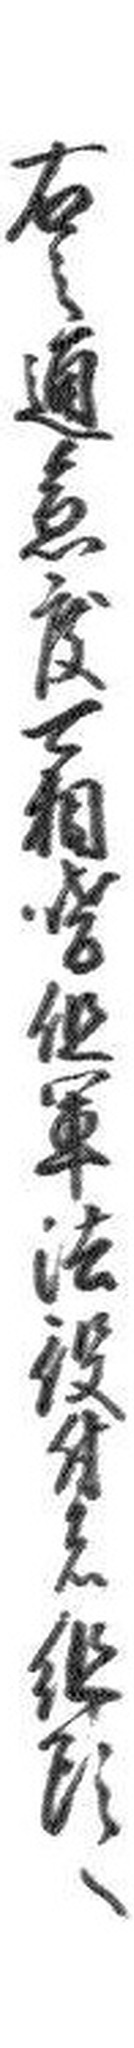右之通急度可相嗜但軍法役付者組頭ヘ
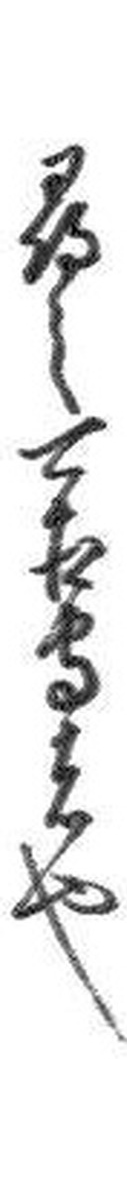尋之可相守者也
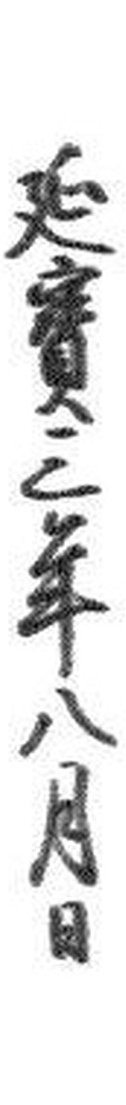延宝三年八月日
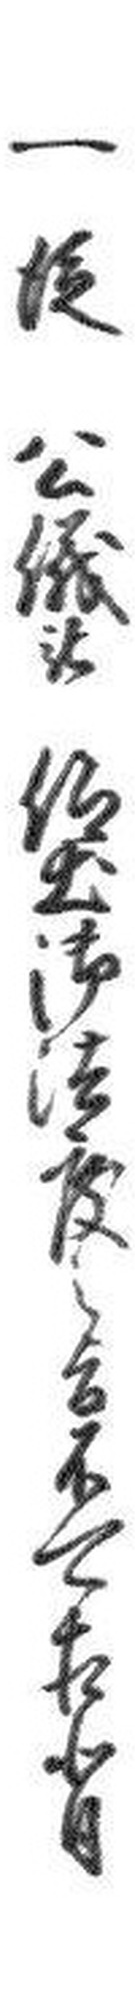一従公儀被仰出御法度之旨不可相背

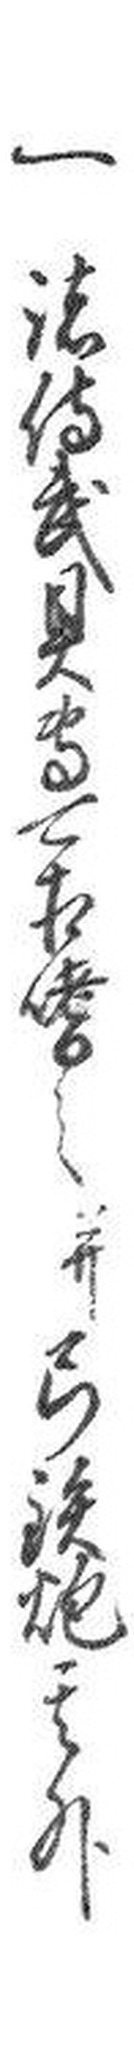一諸侍武具専可相嗜之并弓鉄砲其外
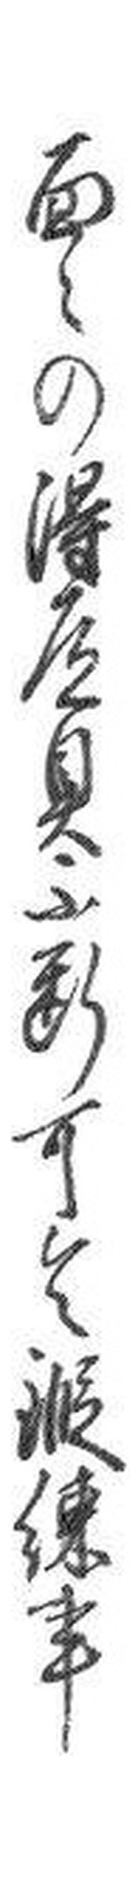面々の得道具不断可令鍛錬事
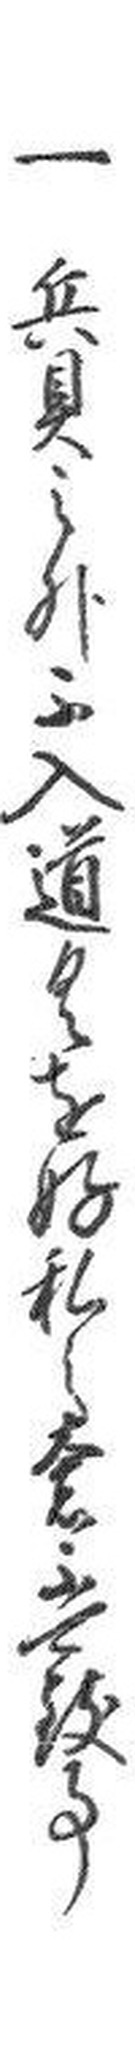一兵具之外不入道具を好私之奢不可致事
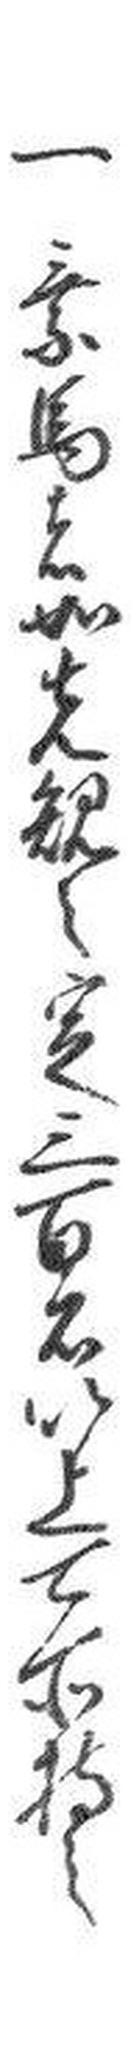一乗馬者如先期之定三百石以上可所持之
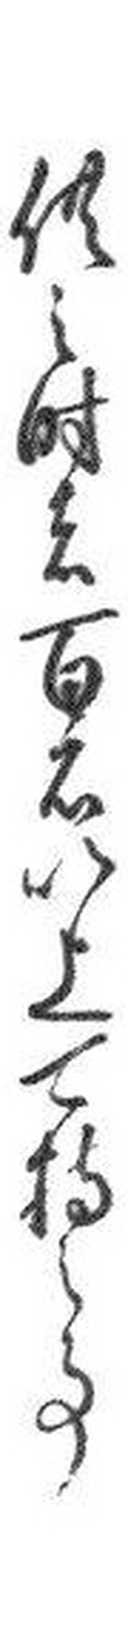供之時者百石以上可持之事
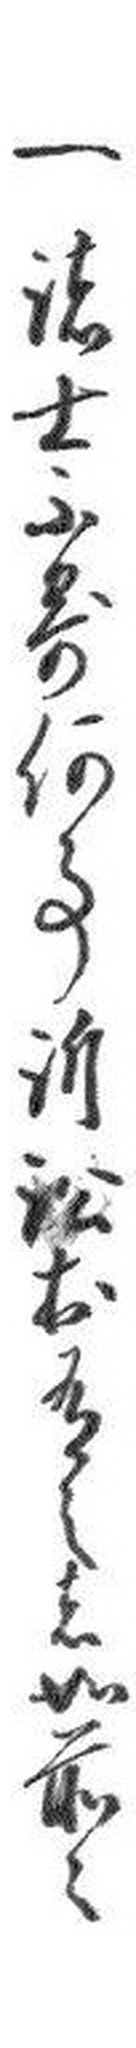一諸士不寄何事訴訟於有之者如前々
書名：家譜 十一 昌親公 従延宝二年到延宝四年八月
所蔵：福井県文書館 Fukui Prefectural Archives
